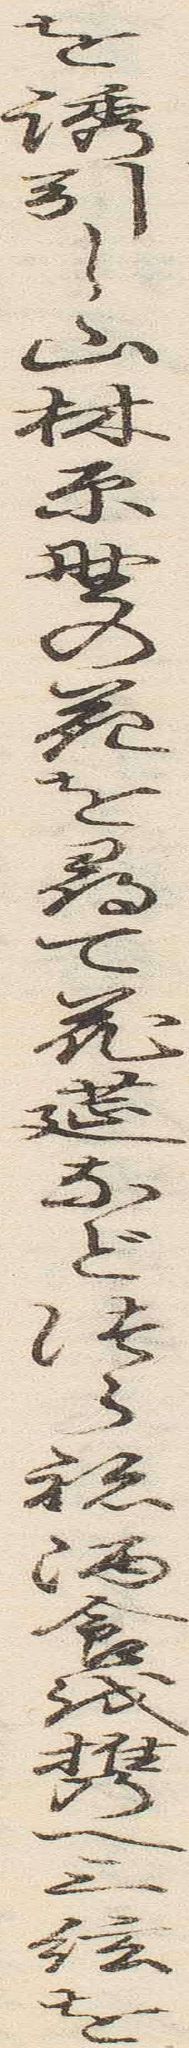を誘引し山林原㙒の花を尋て花筵などつらね酒色を携へ三絃を
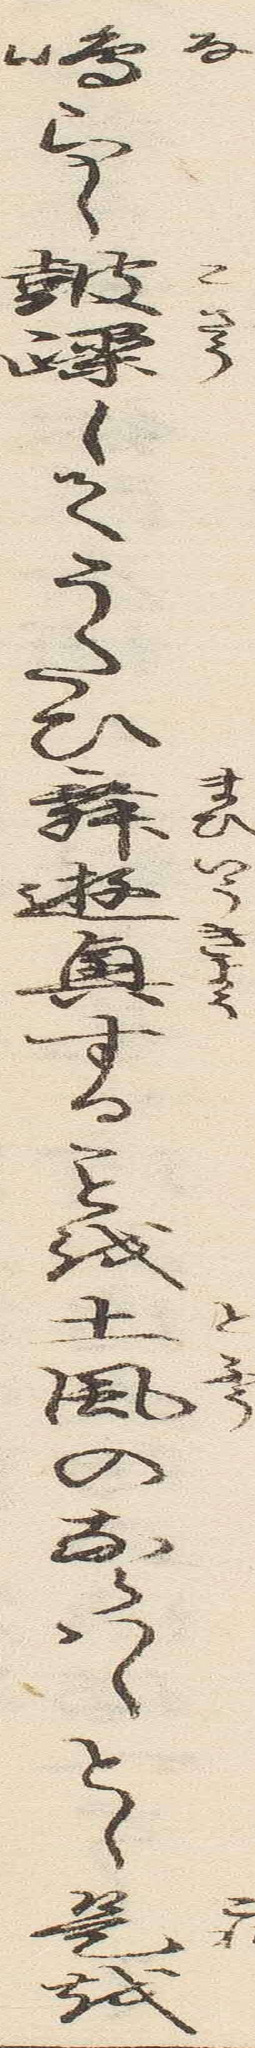鳴らし皷躁してうたひ舞逰興することを土風のならはしとし是を
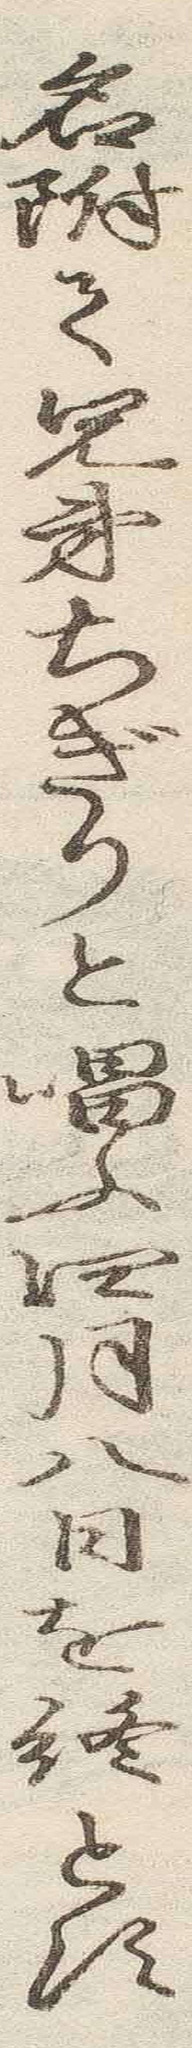名附て兄㐧ちぎりと唱ふ四月八日を終とす
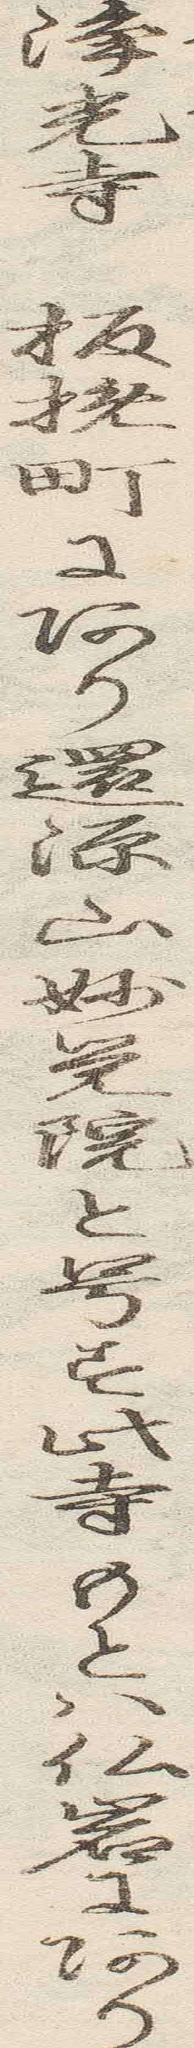浄光寺板挽町にあり還源山妙覚院と号す此寺もとは仏岩にあり
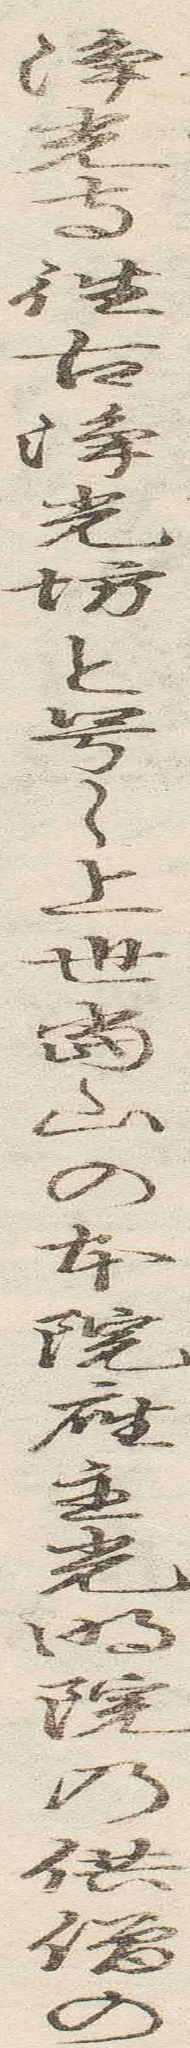浄光寺徃古浄光防と号し上世當山の本院座主光明院の供僧の
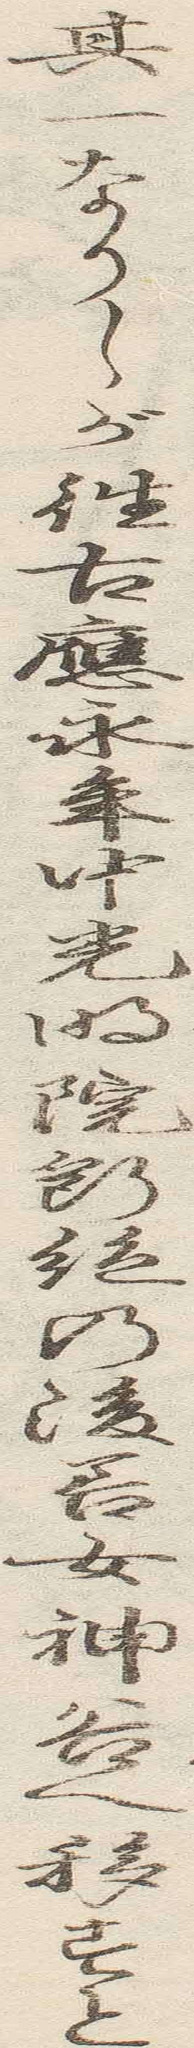其一なりしが徃古應永年中光明院断絶の後善女神谷へ移すと
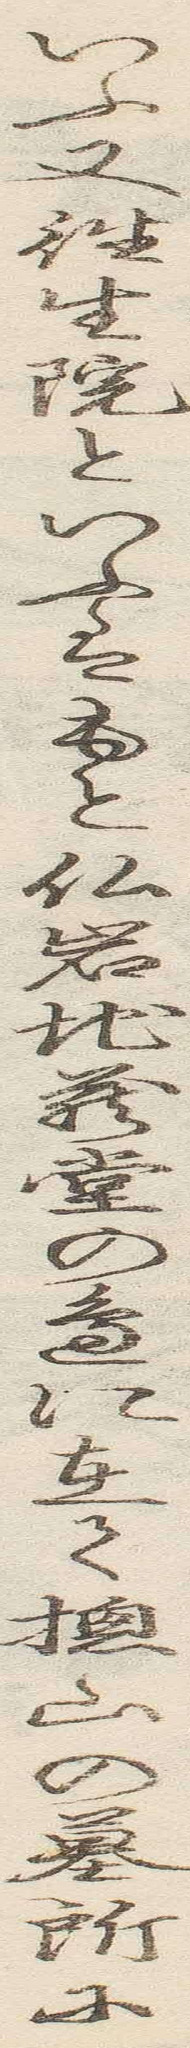いふ又徃生院といふはもと仏岩地蔵堂の邊に在て摠山の墓所に
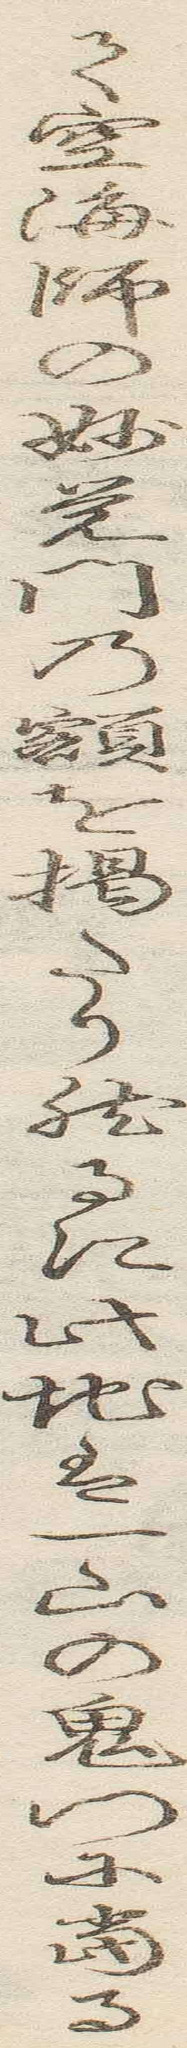て空海師の妙覚門の額を掲たり然るに此地は一山の鬼門に當る
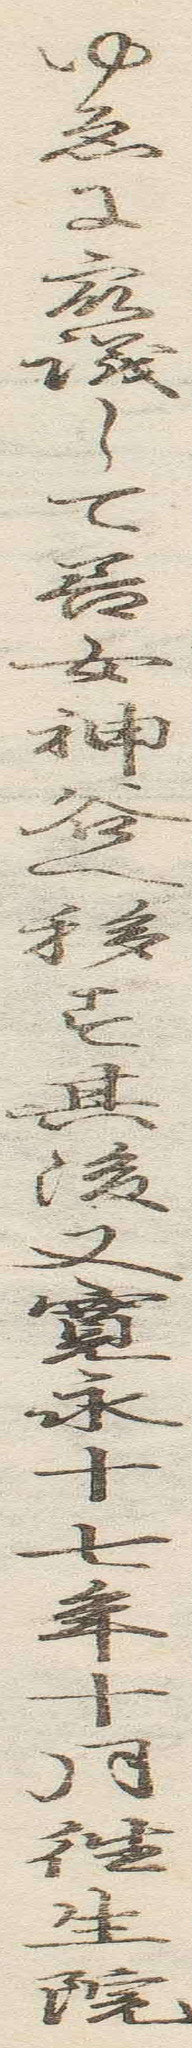ゆゑに衆議して善女神谷へ移す其後又寛永十七年十月徃生院
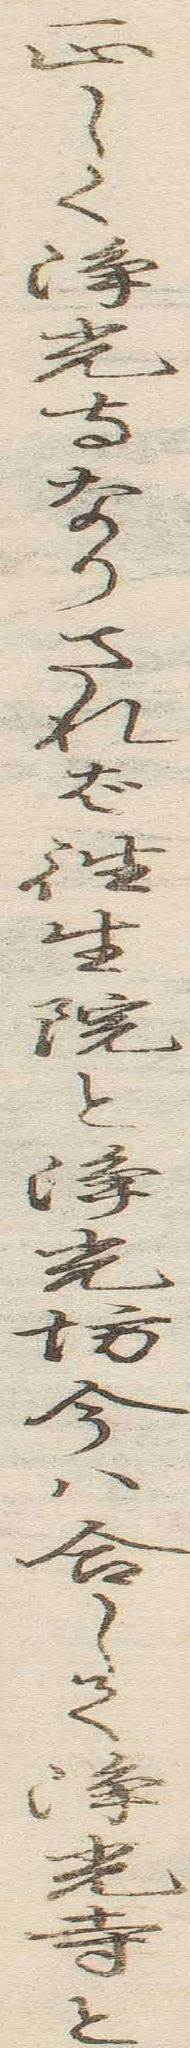正しく浄光寺なりされば徃生院と浄光坊今は合して浄光寺と
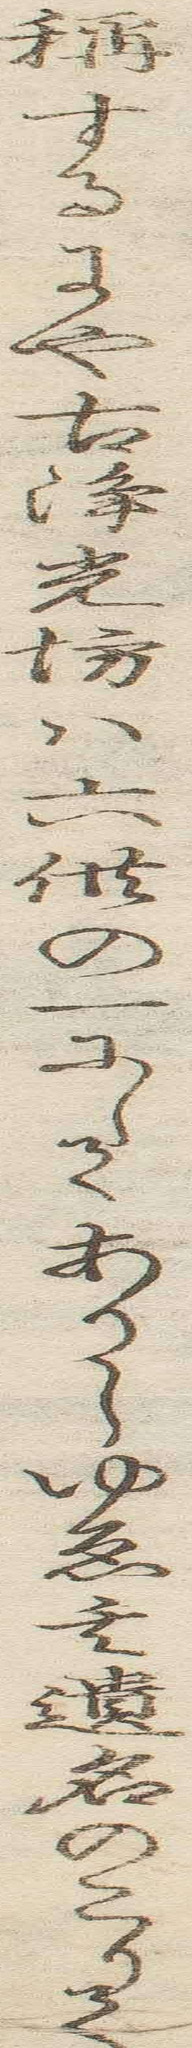稱するにや古浄光坊は六供の一にしてありしゆゑ其遺名のこりて
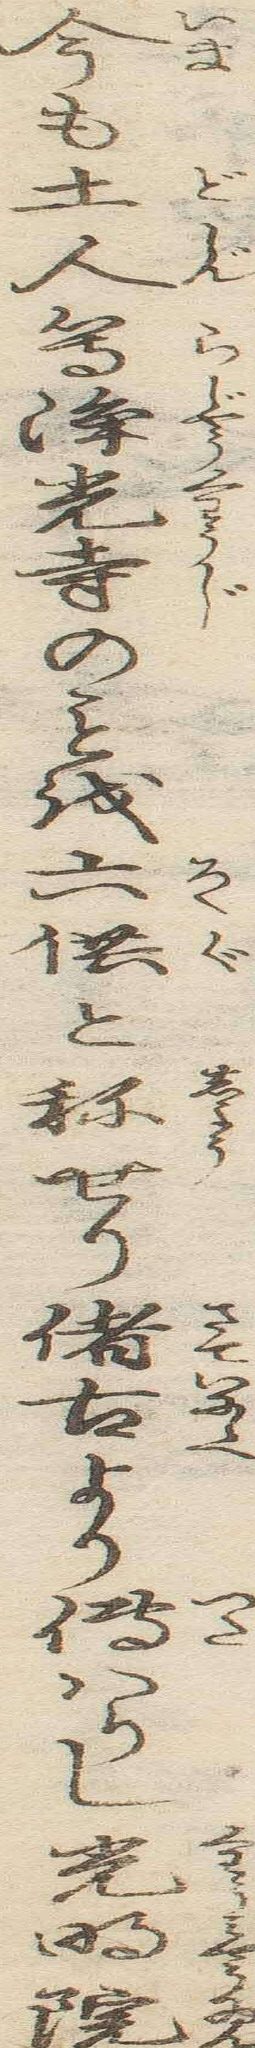今も土人等浄光寺のことを六供と称せり偖古より傳はりし光明院

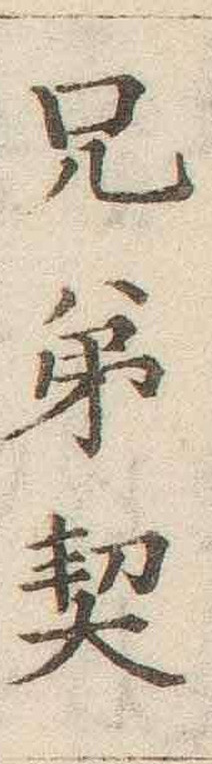兄弟契
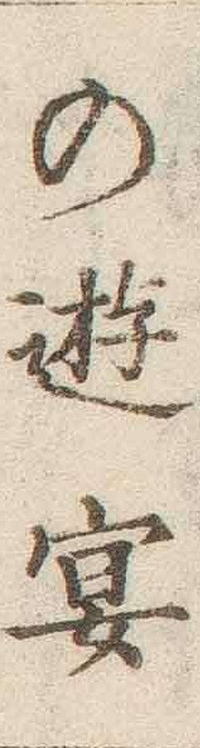の逰宴
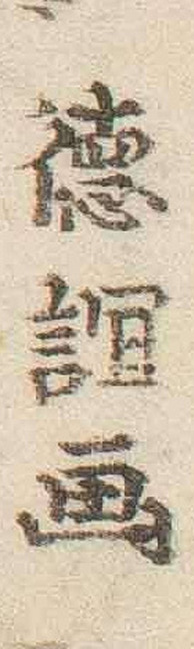德誼画

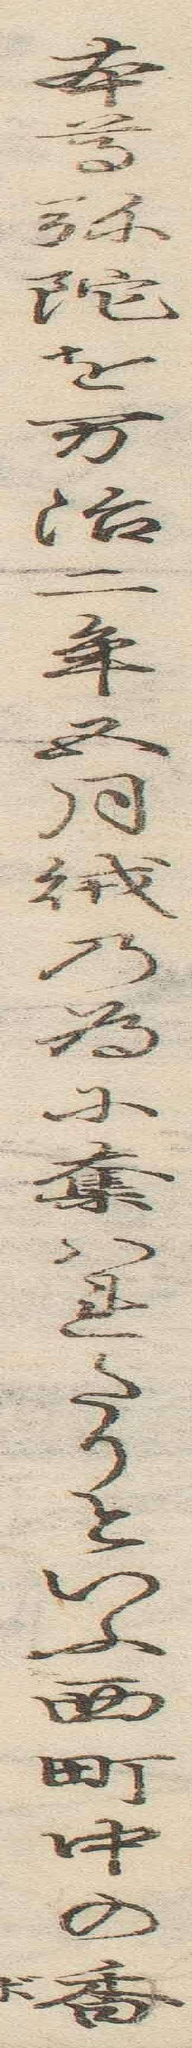本尊弥陀を万治二年五月賊の為に奪はれたりといふ西町中の香
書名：日光山志
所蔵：東京学芸大学附属図書館 国文学研究資料館
